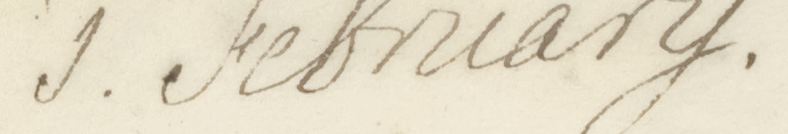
1. February.
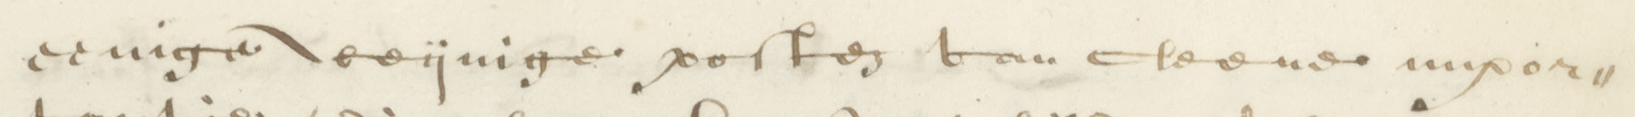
eenige weijnige posten van cleene impor„
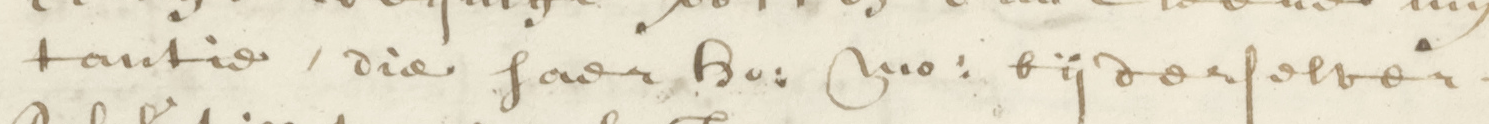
tantie, die haer Ho:Mo: bij derselver
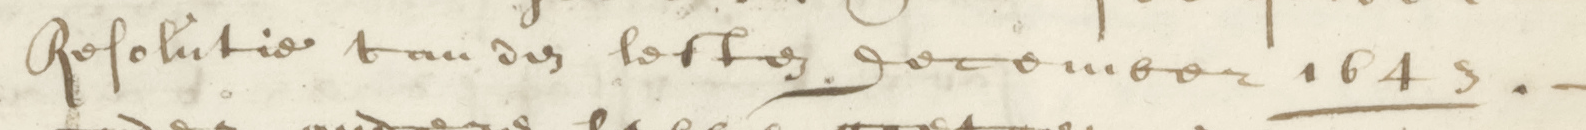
Resolutie van den lesten december 1643. -
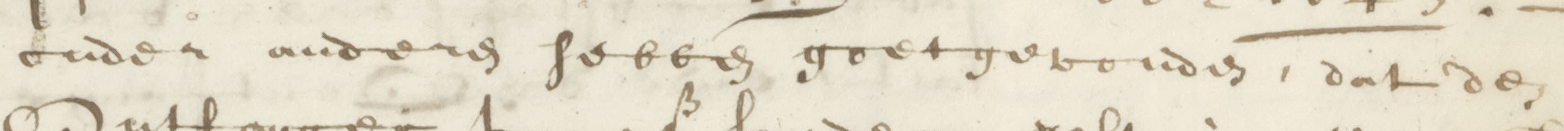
onder anderen hebben goetgevonden, dat de
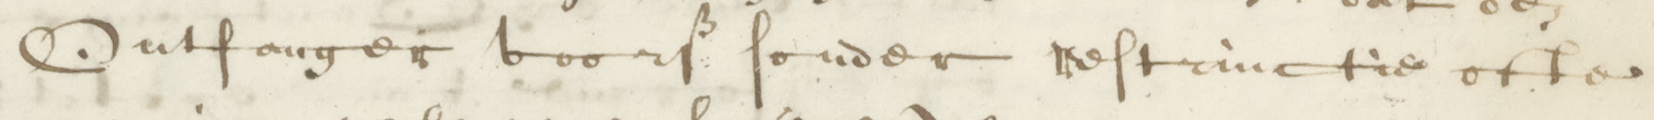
Ontfanger voors sonder restrinctie ofte
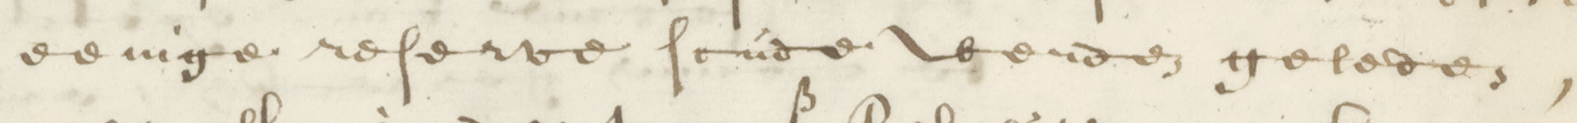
eenige reseve soude werden geleden.
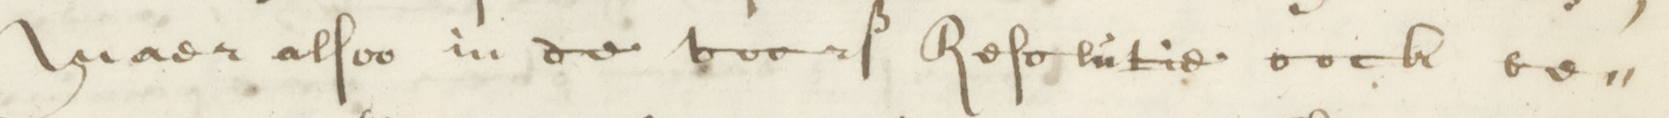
Maer alsoo in de voors Resolutie oock be„
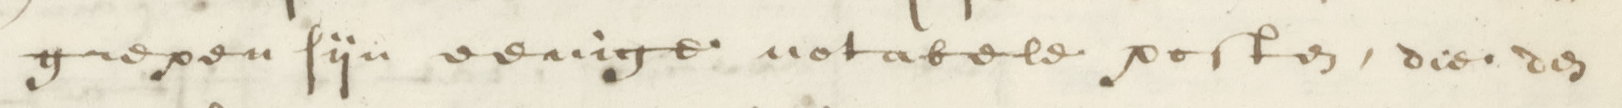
grepen sijn eenige notabele posten, die den
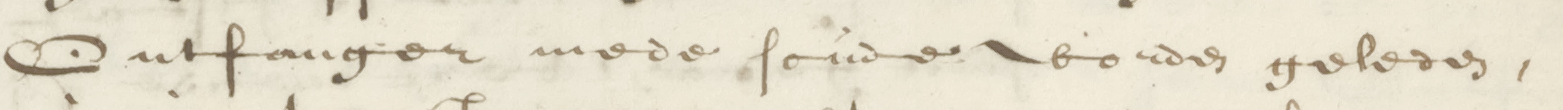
Ontfanger mede soude worden geleden,
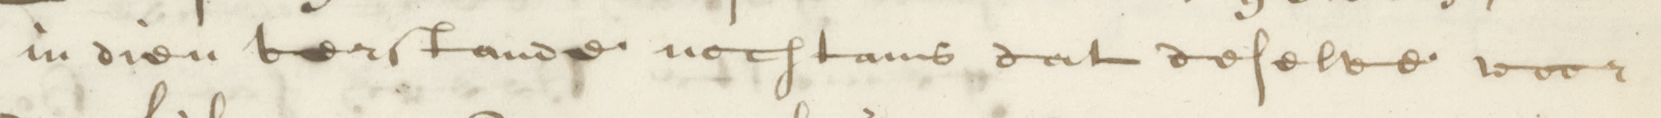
in dien verstande nochtans dat deselve voor
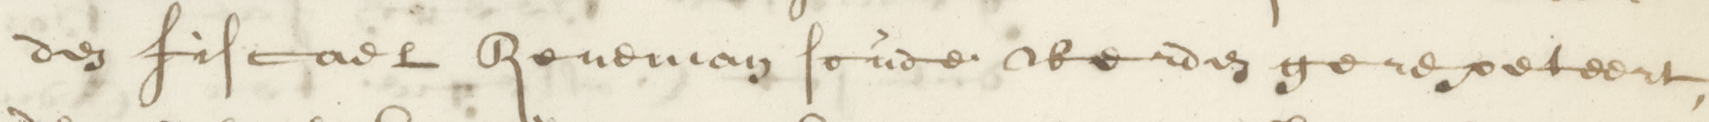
den fiscael Reneman soude werden gerepeteert
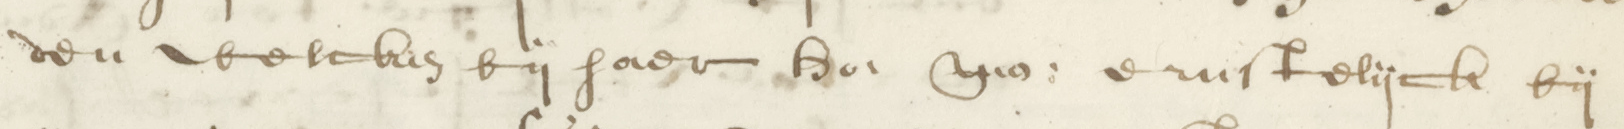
den welcken bij haer Ho:Mo: ernstelijck bij
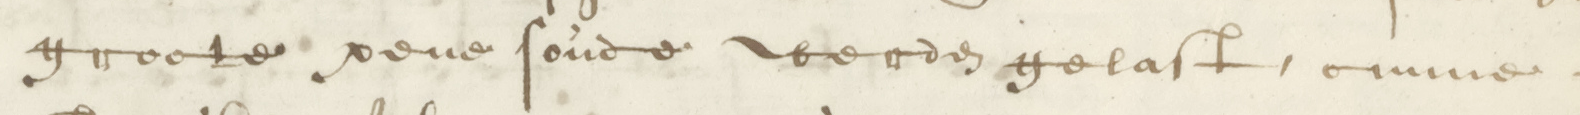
groote pene soude werden gelast, omme
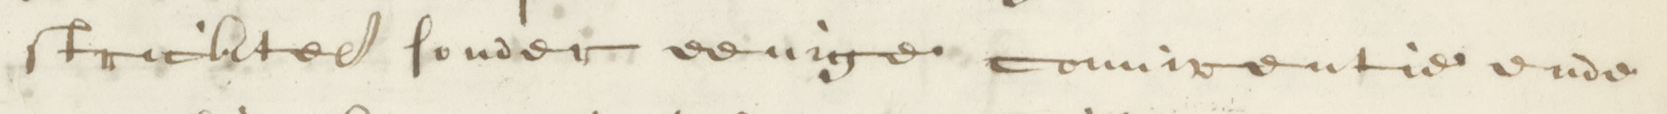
stricktel sonder eenige conniventie ende
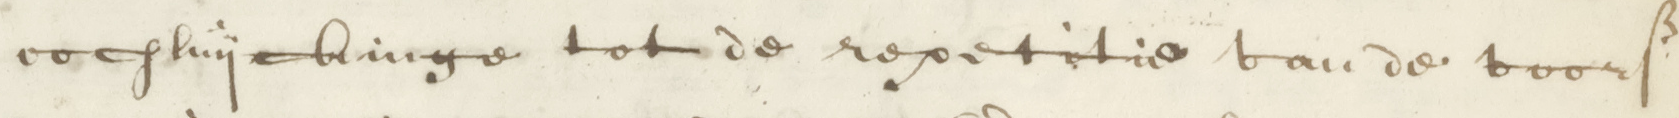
oochluijckinge tot de repetitie van de voors
